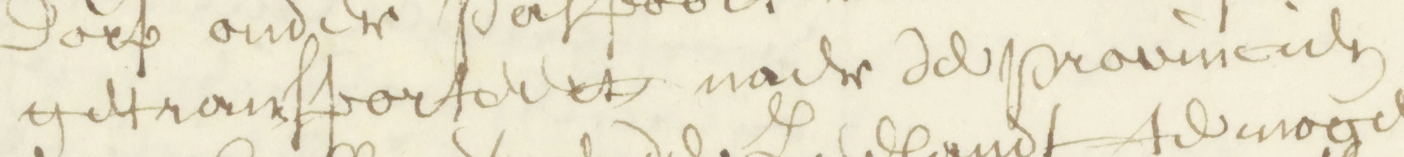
getransporteert, naer de provincien
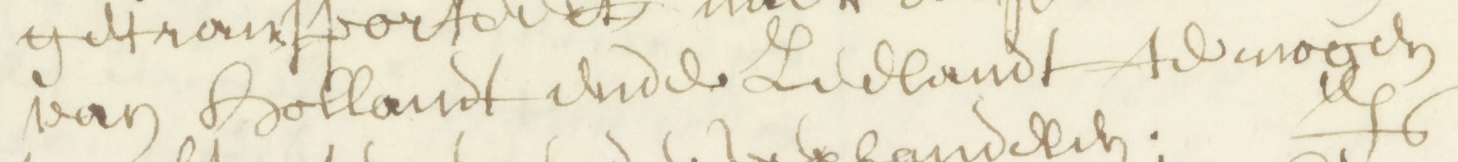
van Hollandt ende Zeelandt te mogen
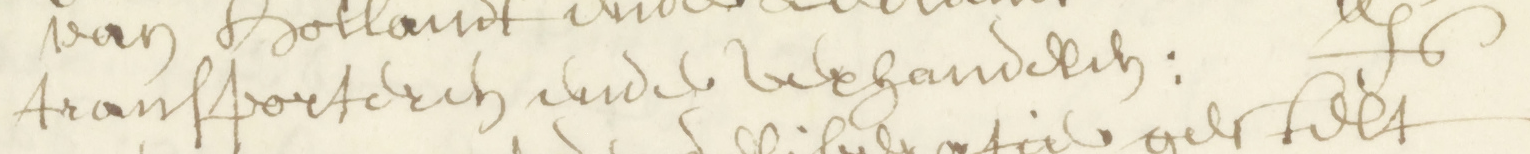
transporteren ende verhandelen: Is
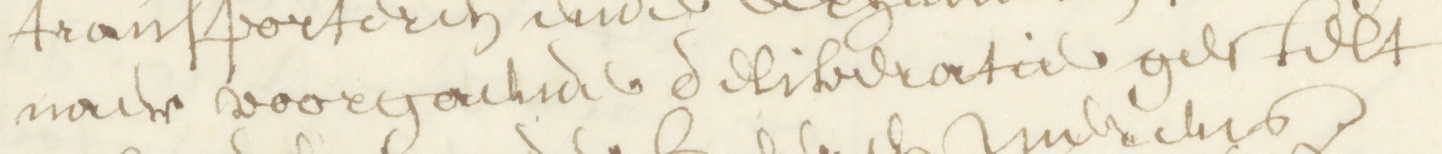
naer voorgaende deliberatie gestelt
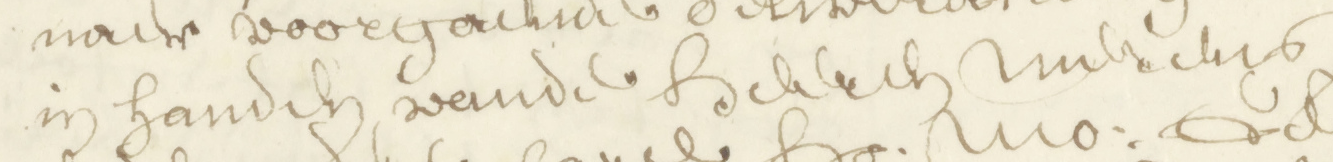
in handen vande Heeren Merens
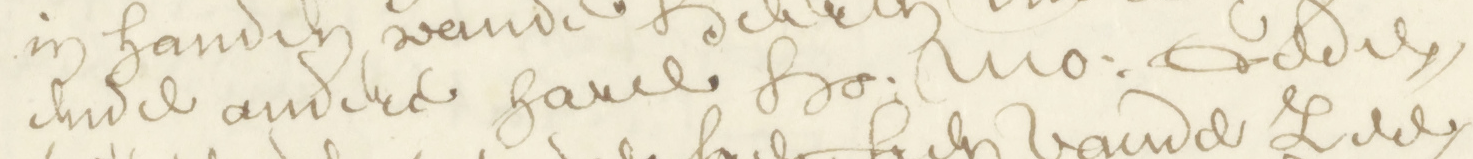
ende andere hare Ho:Mo: Gede,,
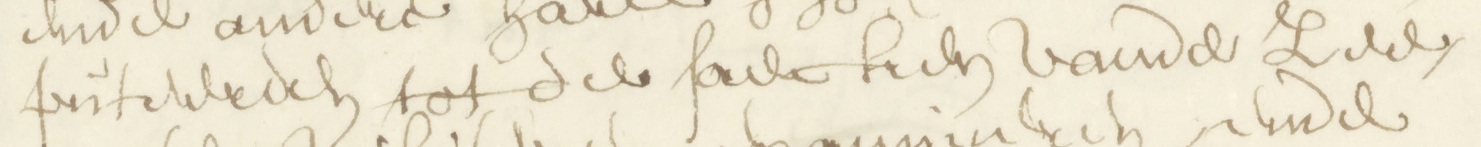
puteerden tot de saecken vande Zee„
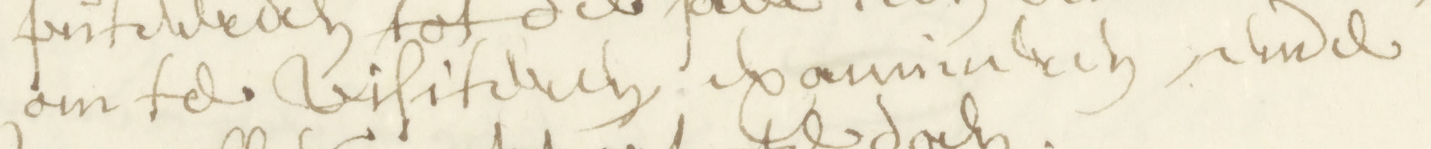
om te visiteren, examineren, ende
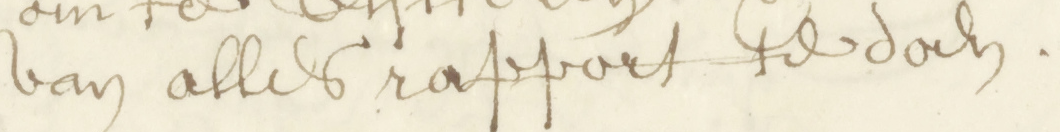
van alles rapport te doen.
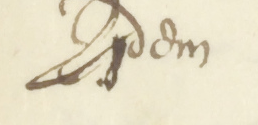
Idem
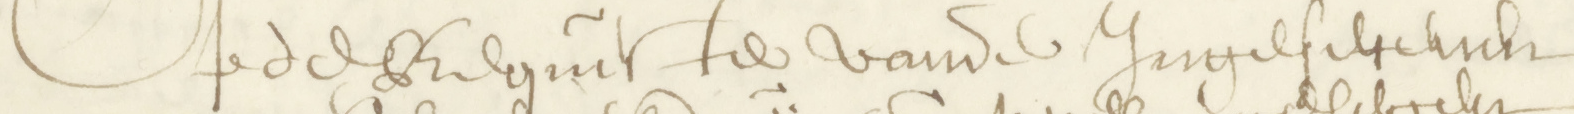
Opde Requeste vande Ingesetenen
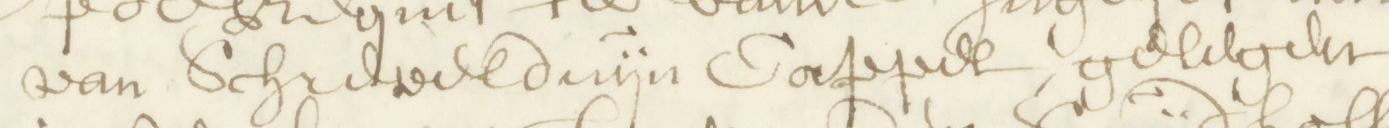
van Schrevelduijn Cappel, gelegen
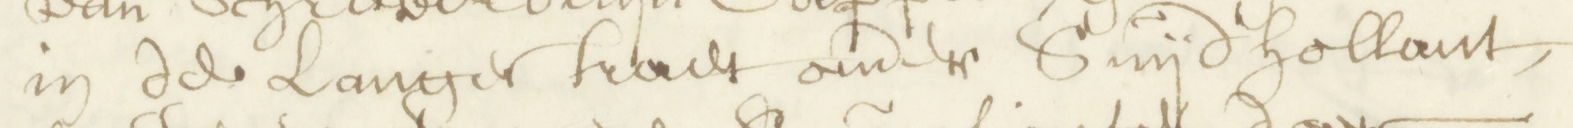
in de Langestraet onder Suijd hollant,
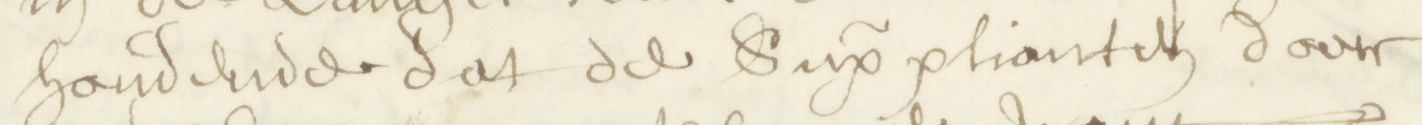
houdende dat de Supplianten door
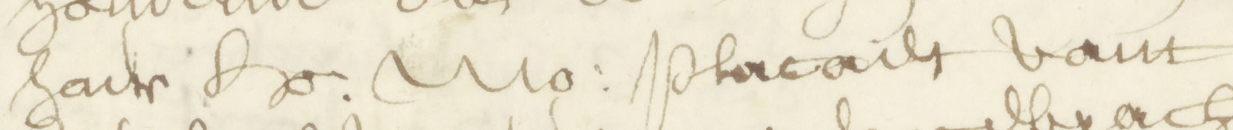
haer Ho:Mo: placaet vant
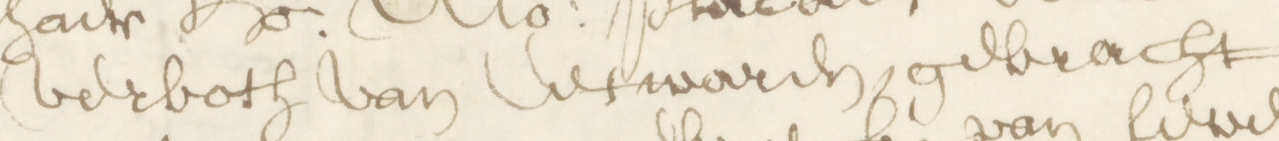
verboth van Eetwaren, gebracht
